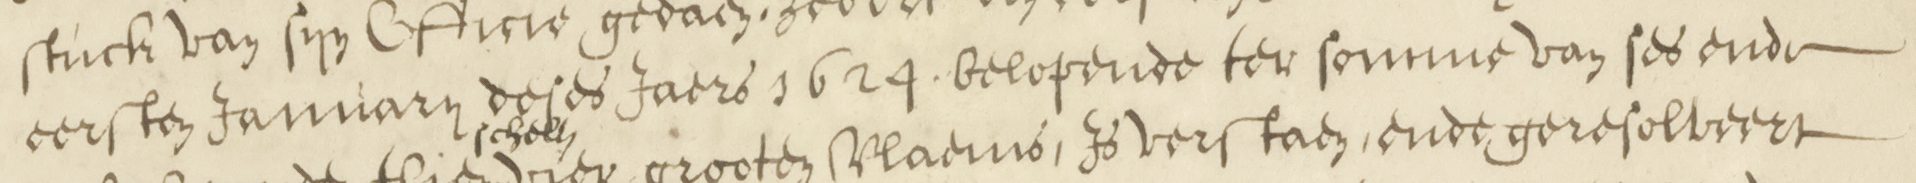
eersten January deses Jaers 1624. belopende ter somme van ses ende
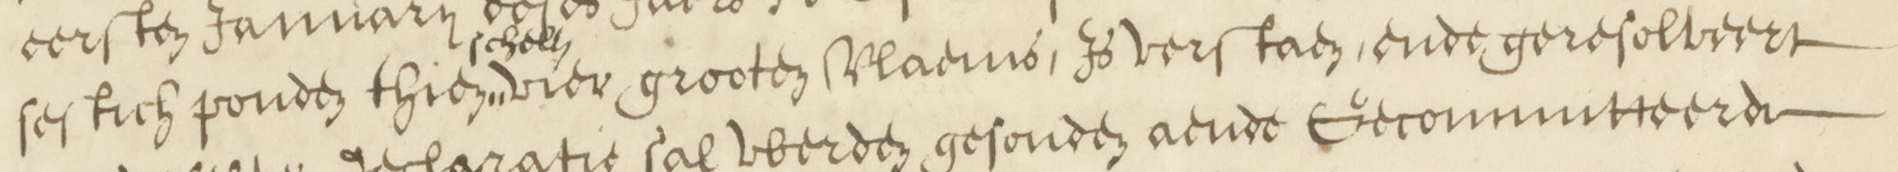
sestich ponden thien„schel vier grooten Vlaems, Is verstaen, ende geresolveert
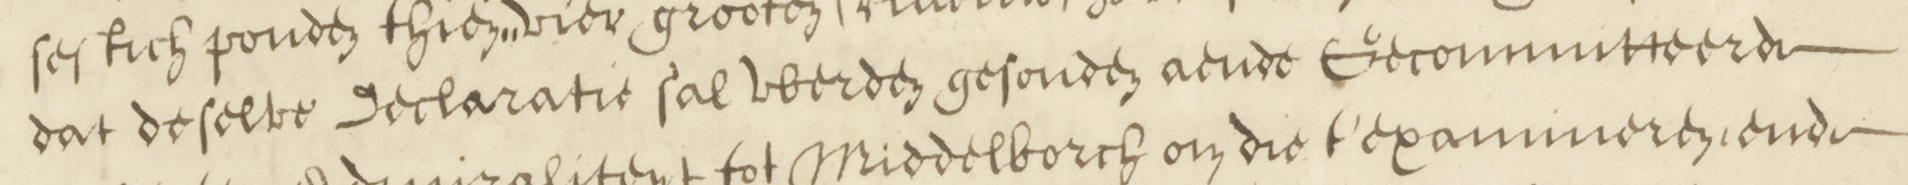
dat deselve Declaratie sal werden gesonden aende Gecommitteerde
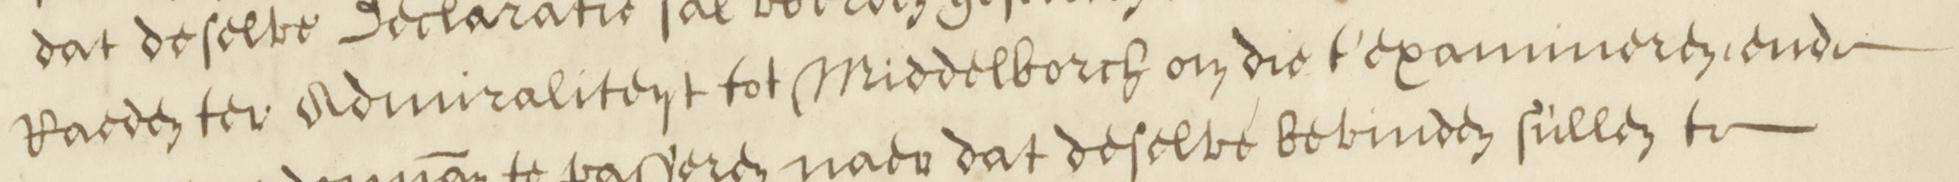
Raeden ter Admiralityt tot Middelborch om die t‛examineren, ende
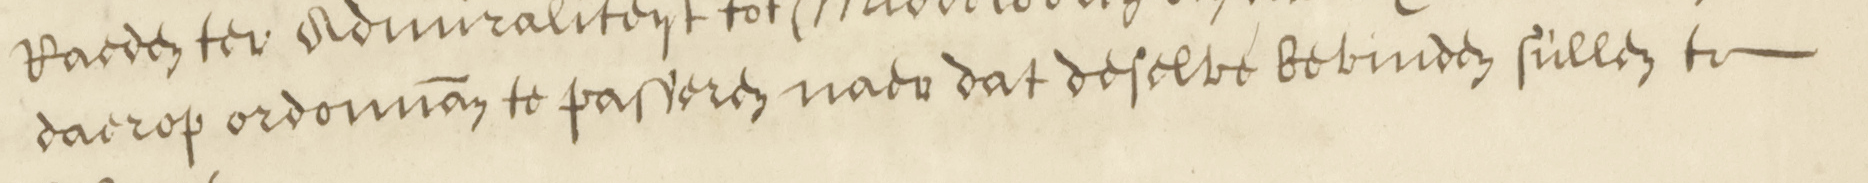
daerop ordonnan te passeren naer dat deselve bevinden sullen te
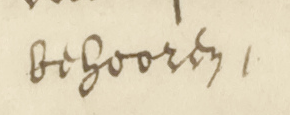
behooren.
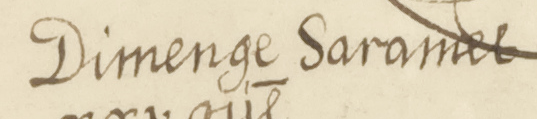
Dimenge Saramet
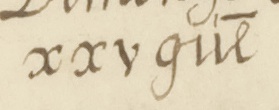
xxv gul
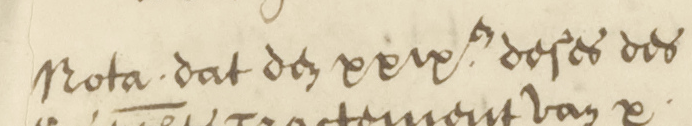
Nota, dat den xxixen. deses des
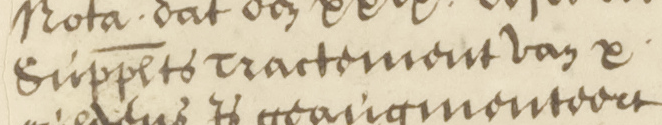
Supplts tractement van x
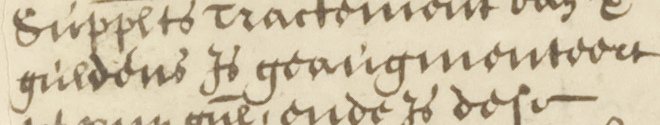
guldens Is geaugmenteert
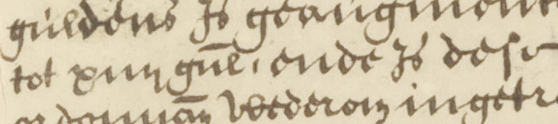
tot xiiij gul, ende Is dese
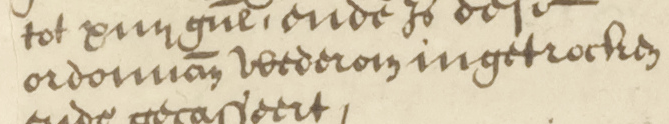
ordonnan wederom ingetrocken
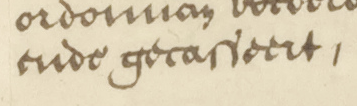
ende gecasseert,
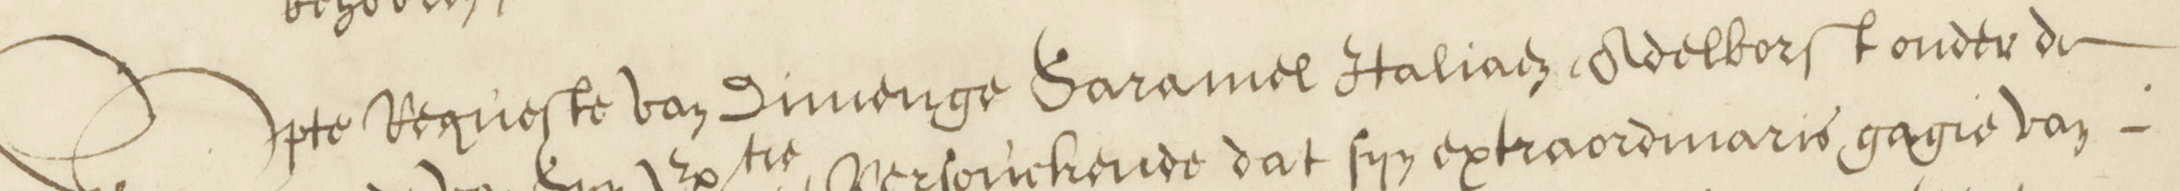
Opte Requeste van Dimenge Saramel Italiaen, Adelborst onder de
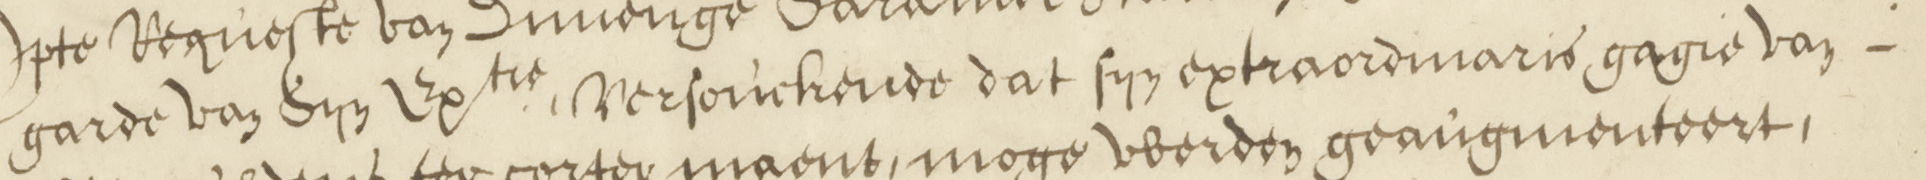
garde van Syn Extie., versouckende dat syn extraordinaris gagie van -
